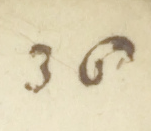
36
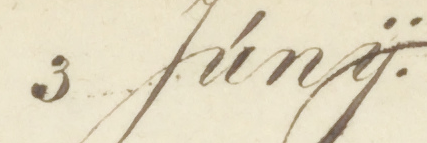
3 Junij
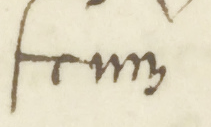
fcum
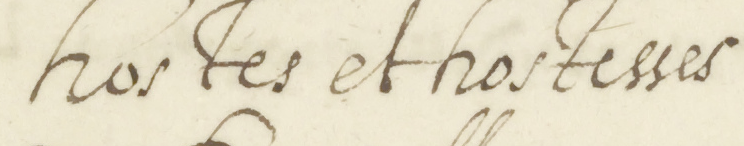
hostes et hostesses
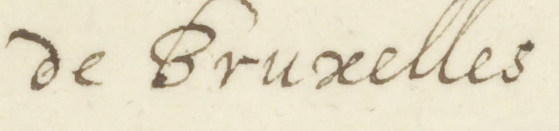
de Bruxelles
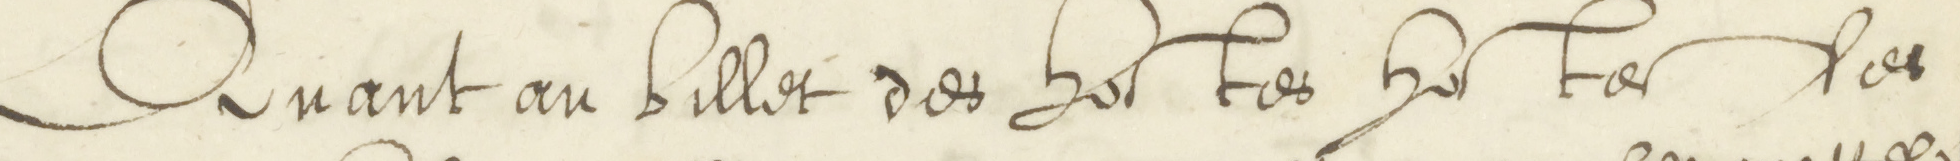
Quant au billet des hostes hostesses
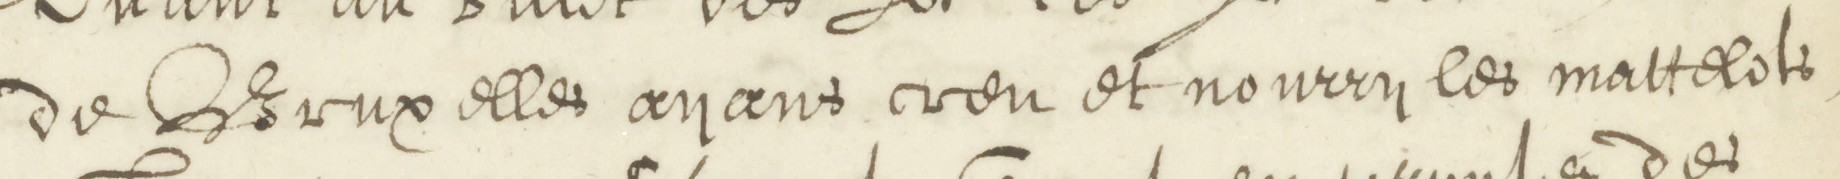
de Bruxelles ayans creu et nourry les maltelots
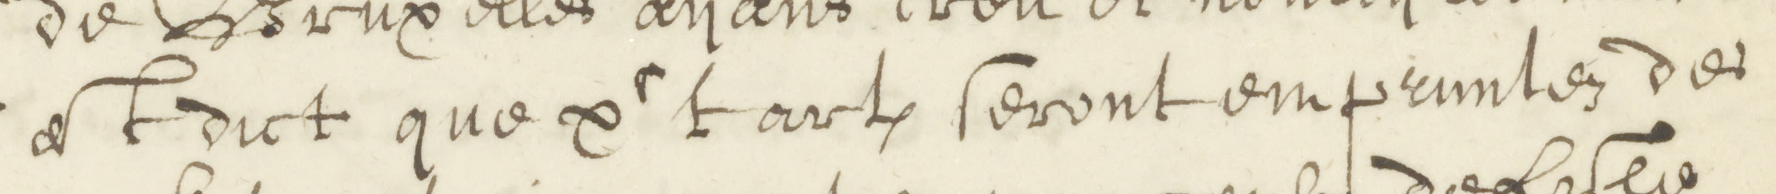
est dict que xc L. arth seront empruntez des
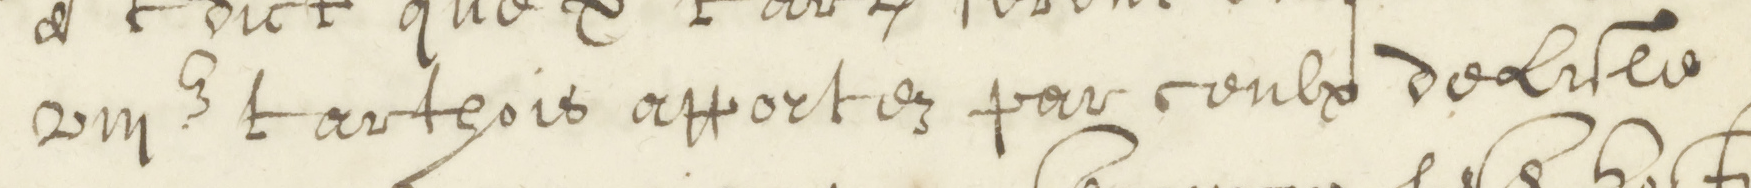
viiim L. arthois apportez par ceulx de Lisle
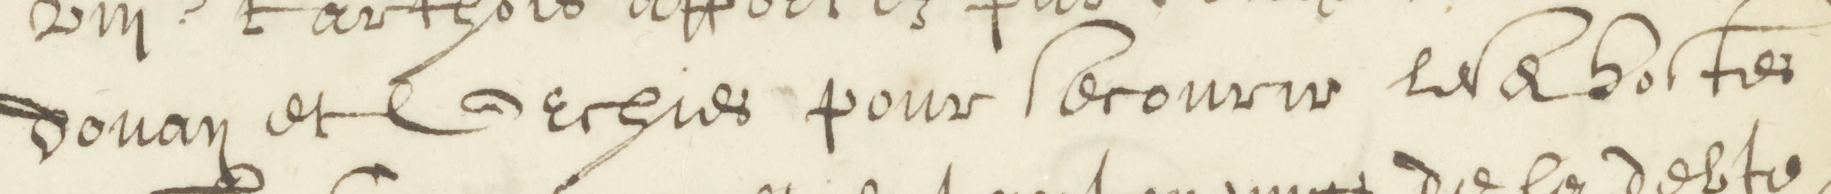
Douay et Orchies pour secourir lesd hostes
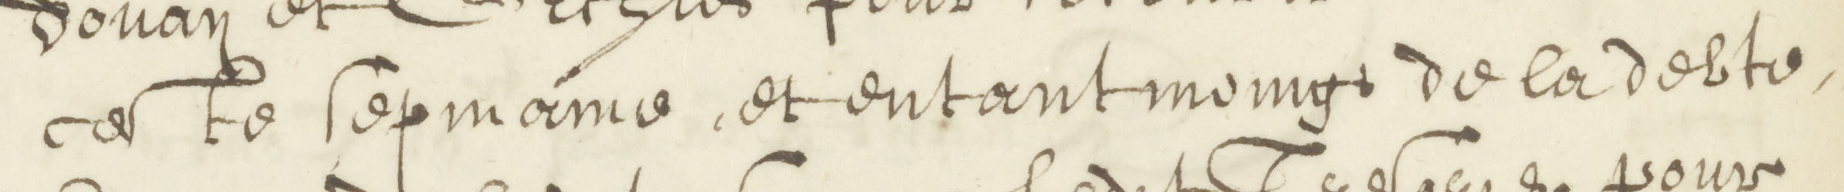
ceste sepmaine, et entant moings de la debte.
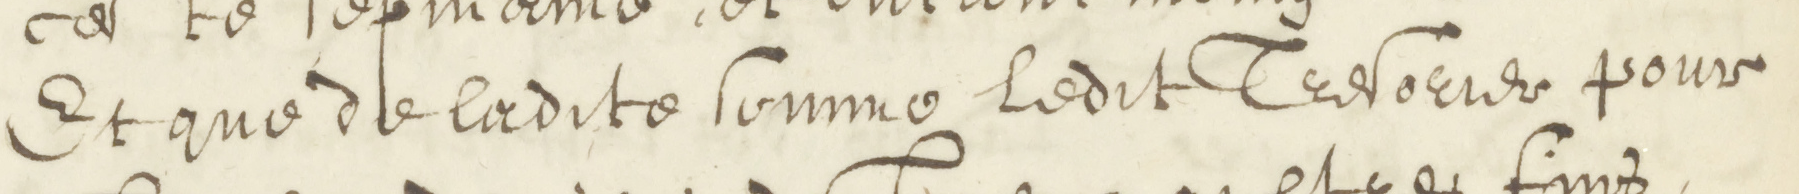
Et que de ladite somme ledit Tresorier pour
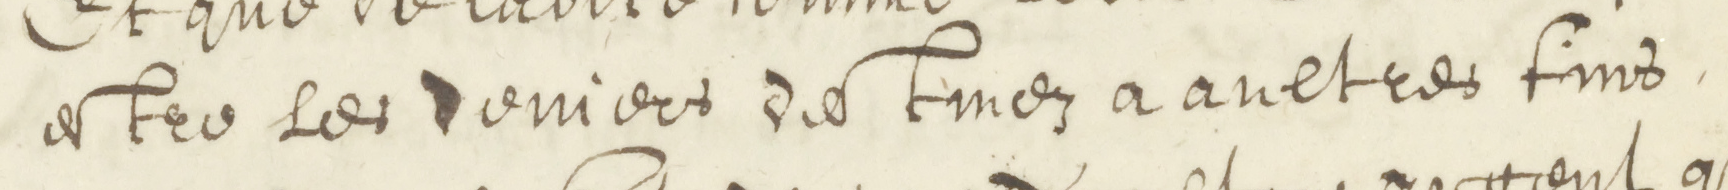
estre les deniers destinez a aultres fins
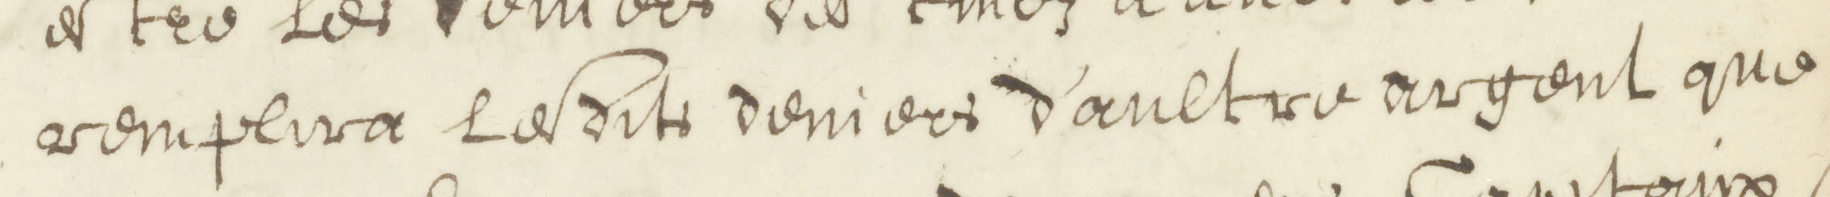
remplira lesdits deniers d'aultre argent que
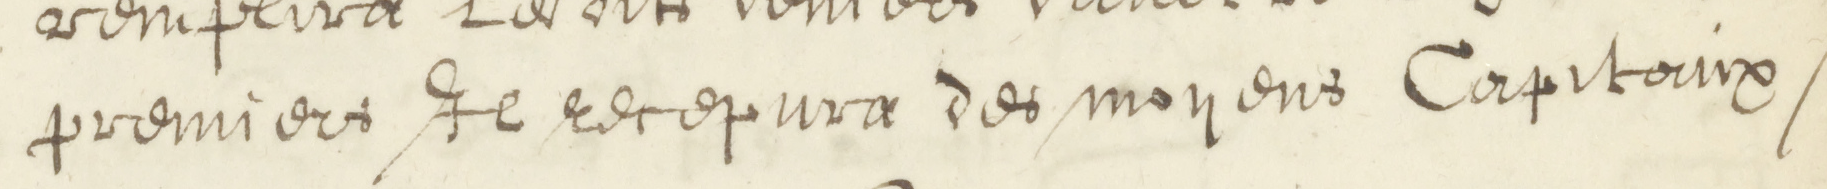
premiers Il recepura des moyens capitaux.
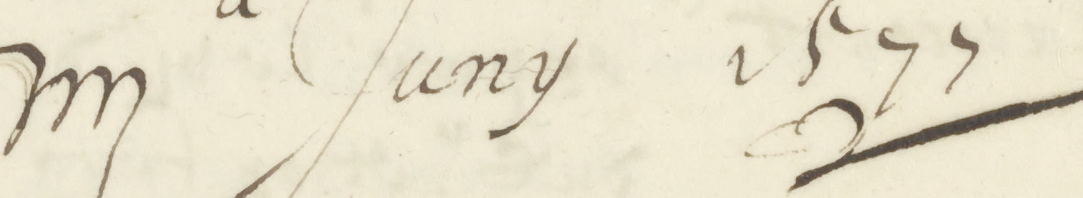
iiiia juny 1577
